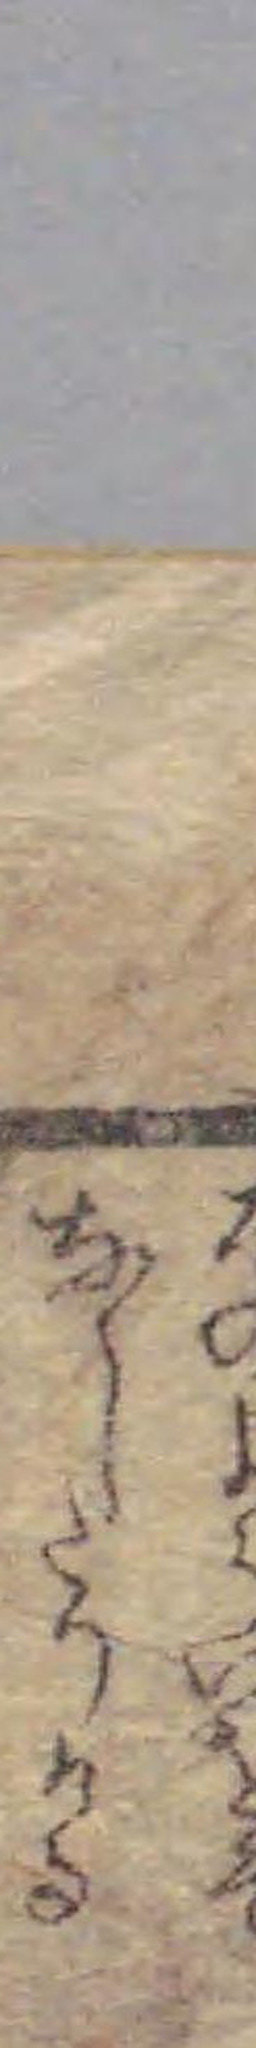なしたりける

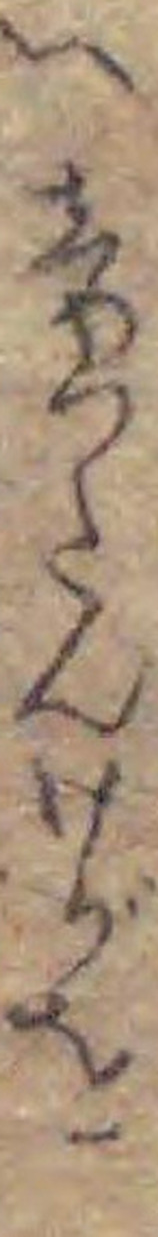〽しゆつたんけがを
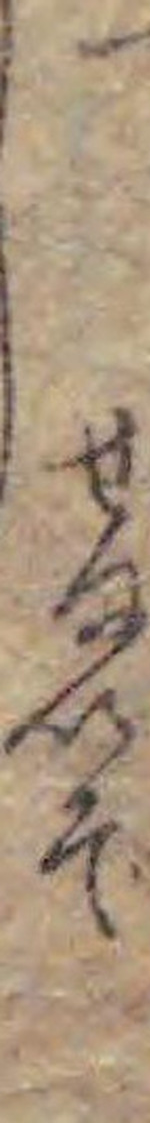せまいぞ
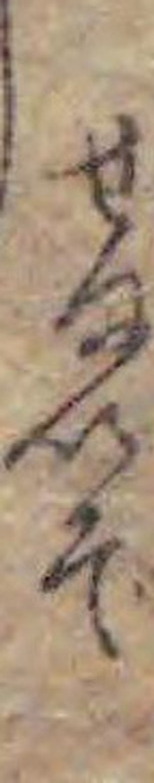せまいぞ
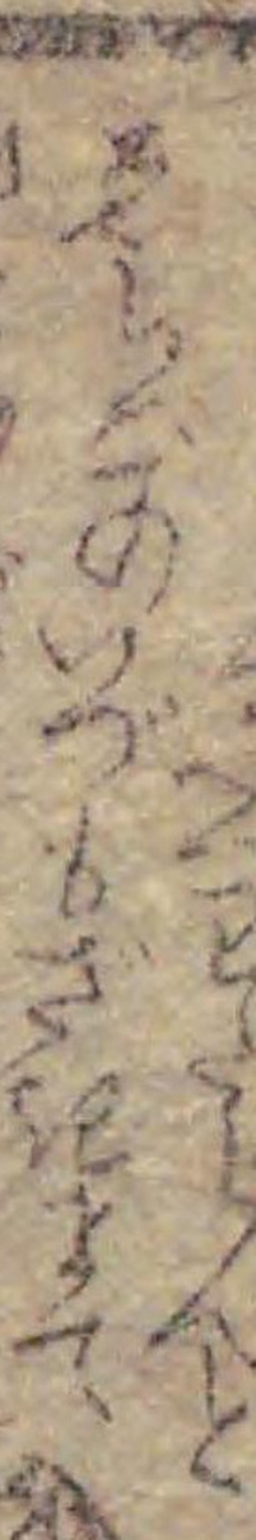ゑちごのいづもざきまて
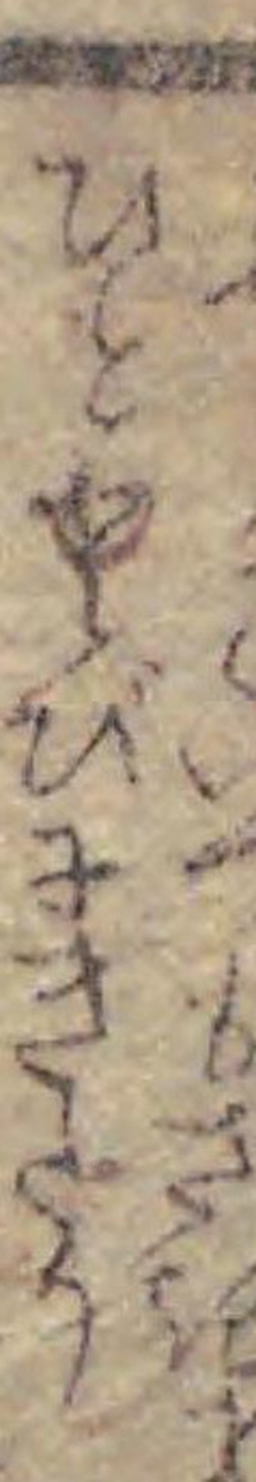ひととびにきたり
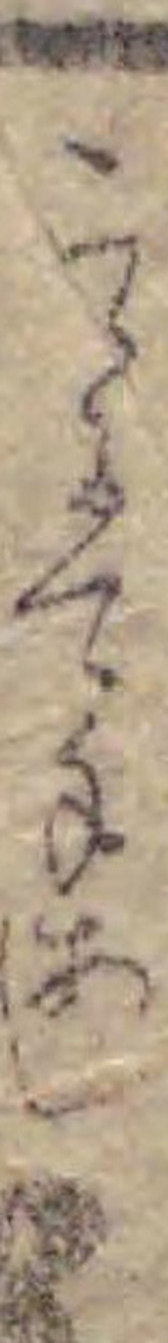こゝにて手あし
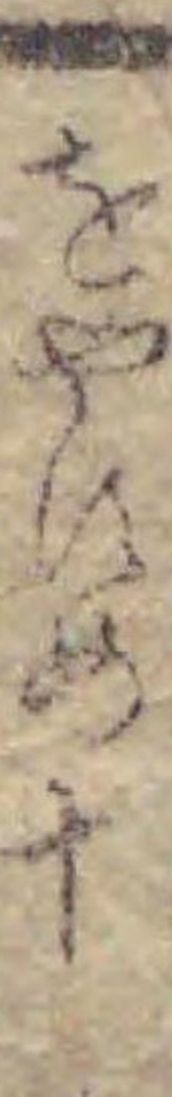をやすめ十
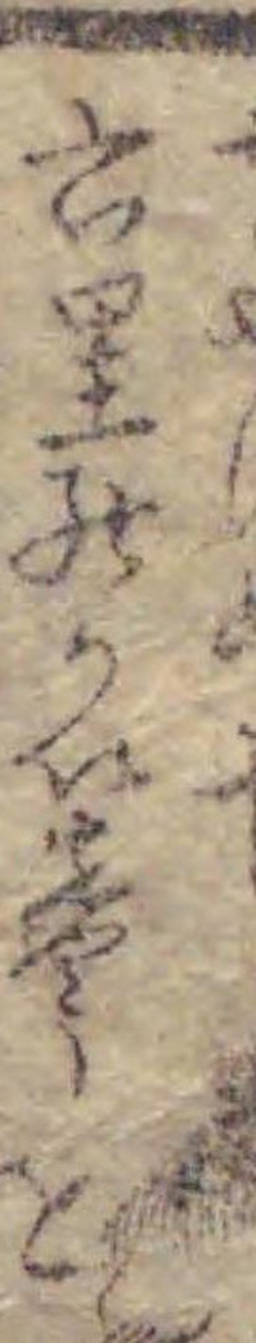六里のかいしやうを
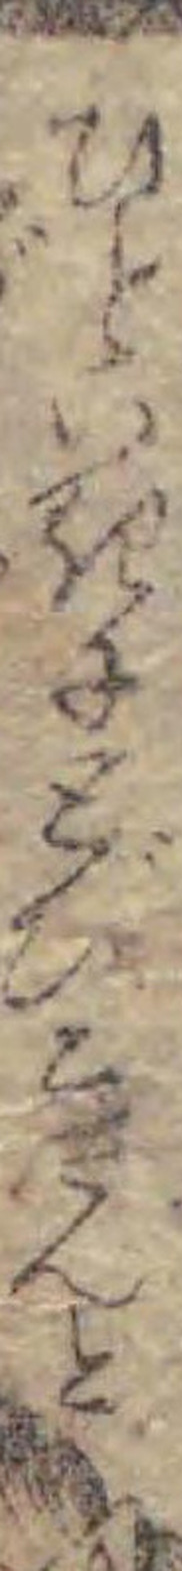ひといきにとびこさんと
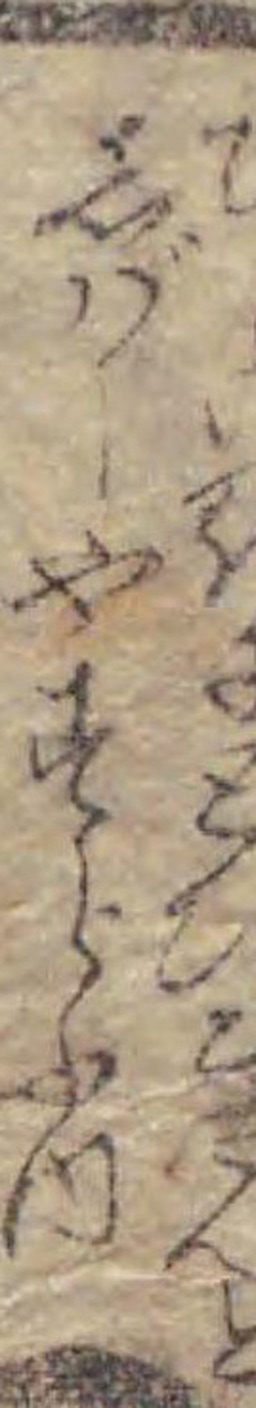しばしやすらふ内
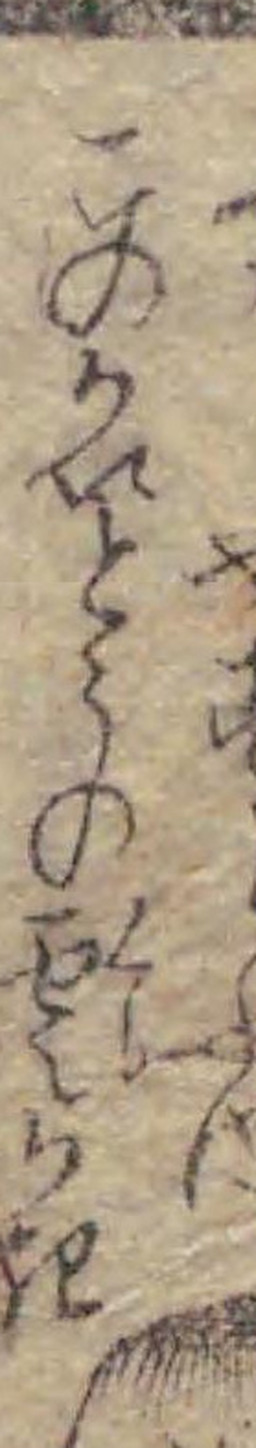このかいとうの雲かき
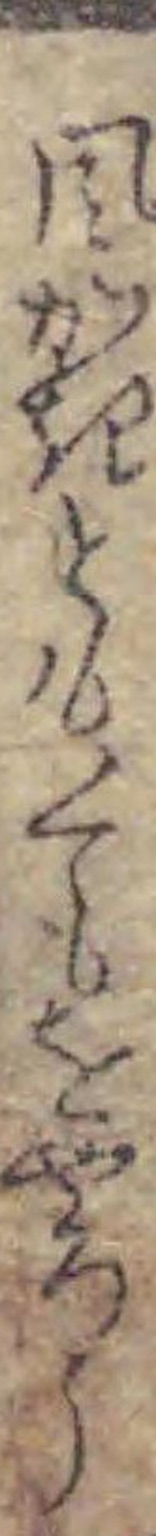風かきともくもをやろう
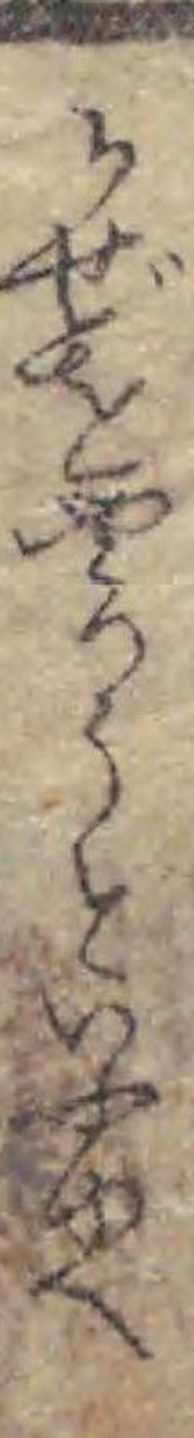かぜをやろうといふゆへ
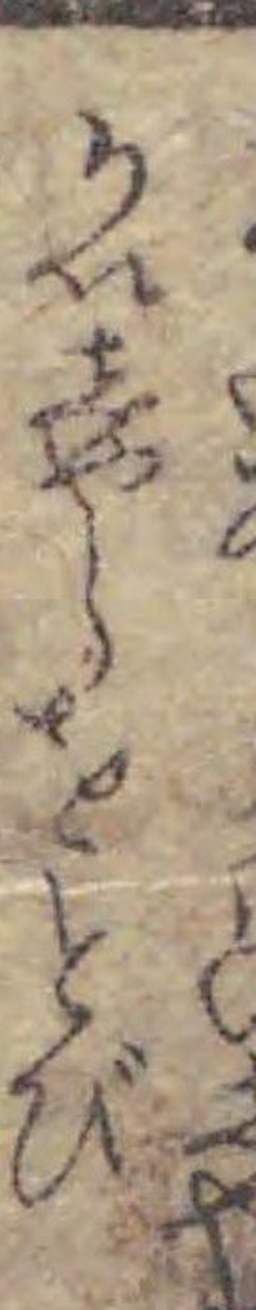かいしやうをとび
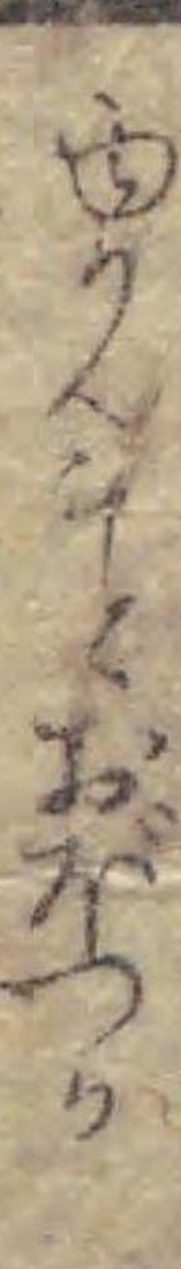ゆかんことおぼつか
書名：化物世界夜半嵐 : 3巻
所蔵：国立国会図書館 National Diet Library, JAPAN
